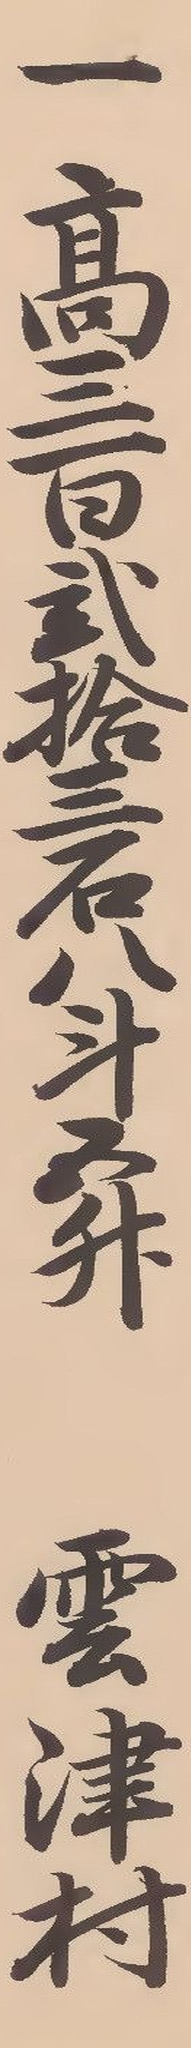一高三百弐拾三石八斗五升雲津村
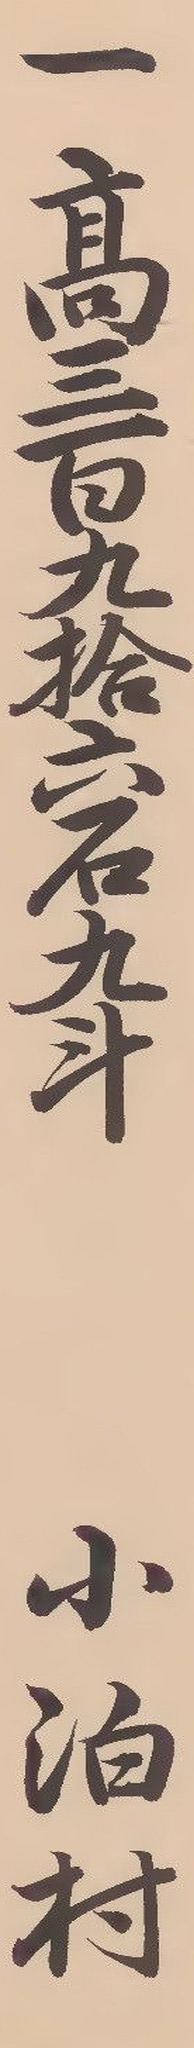一高三百九拾六石九斗小泊村

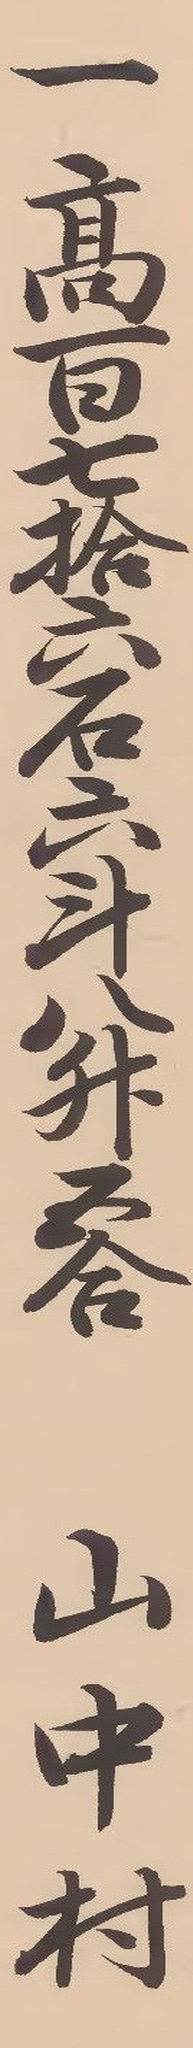一高百七拾六石六斗八升五合山中村
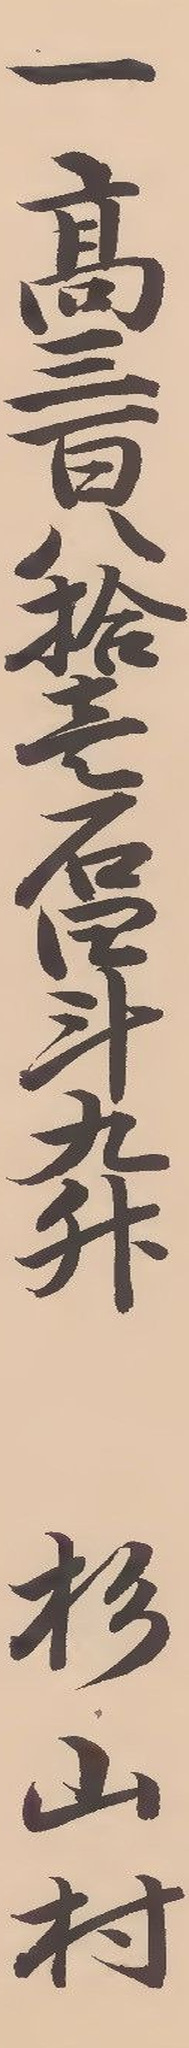一高三百八拾壱石四斗九升杉山村
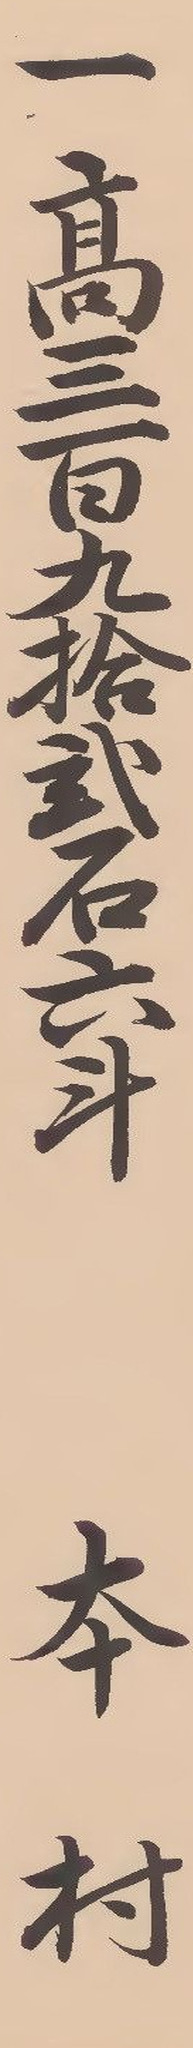一高三百九拾弐石六斗本村
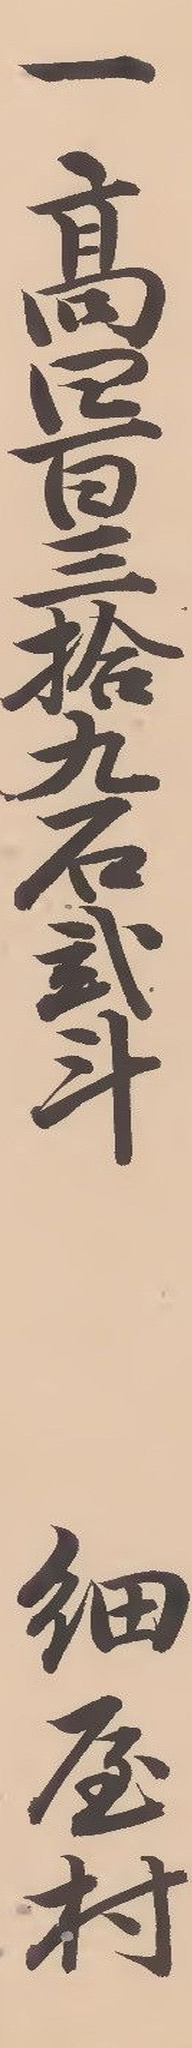一高四百三拾九石弐斗細屋村
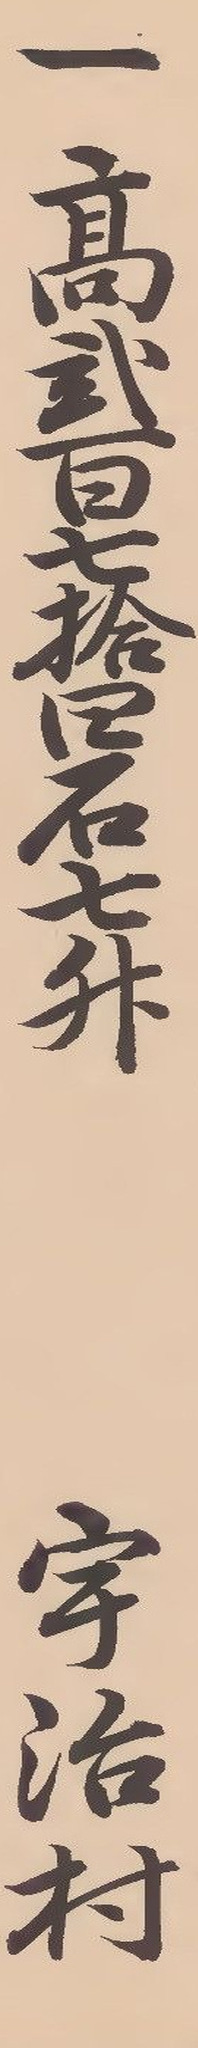一高弐百七拾四石七升宇治村
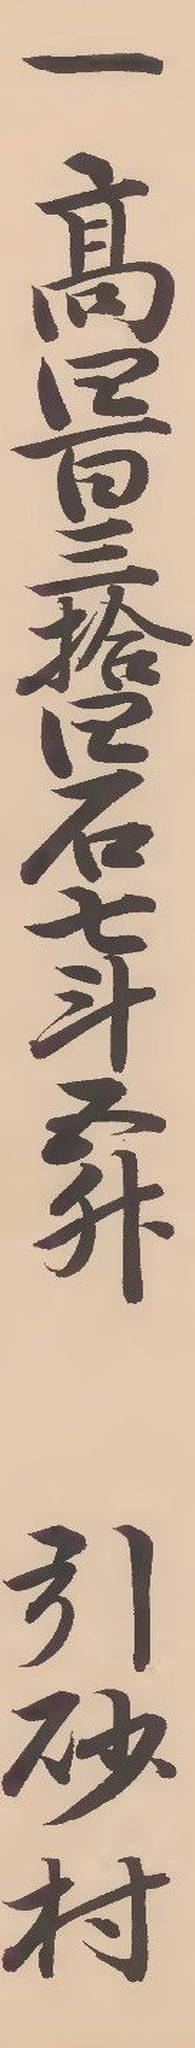一高四百三拾四石七斗五升引砂村

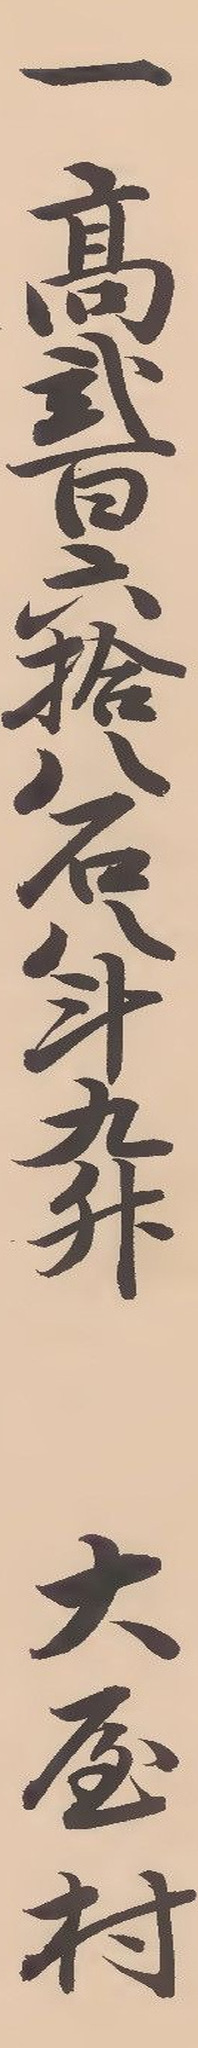一高弐百六拾八石八斗九升大屋村
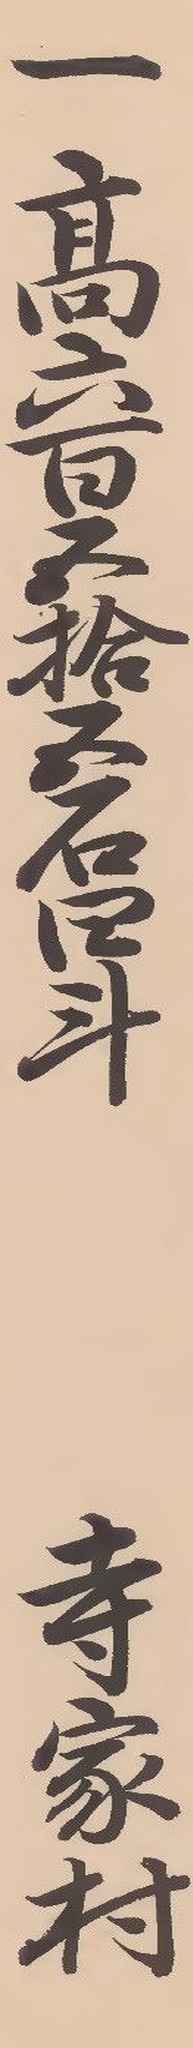一高六百五拾五石四斗寺家村
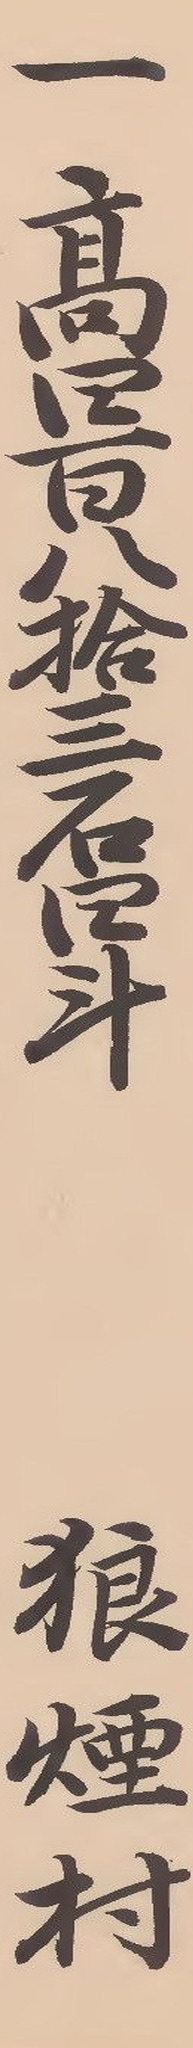一高四百八拾三石四斗狼煙村
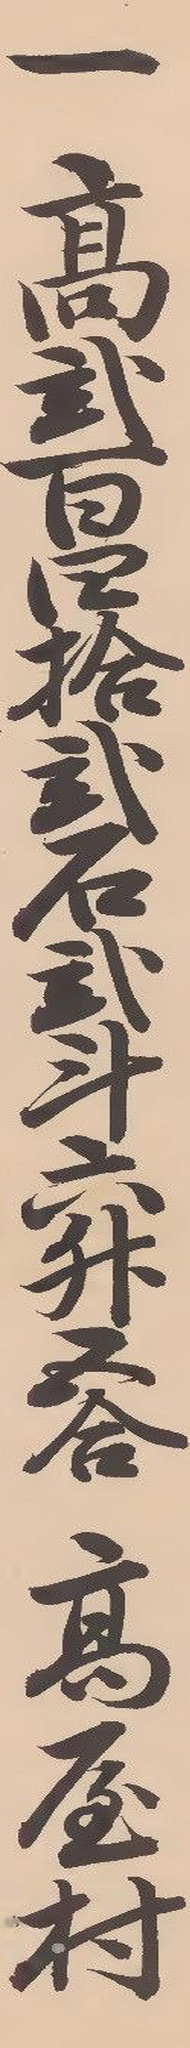一高弐百四拾弐石弐斗六升五合高屋村
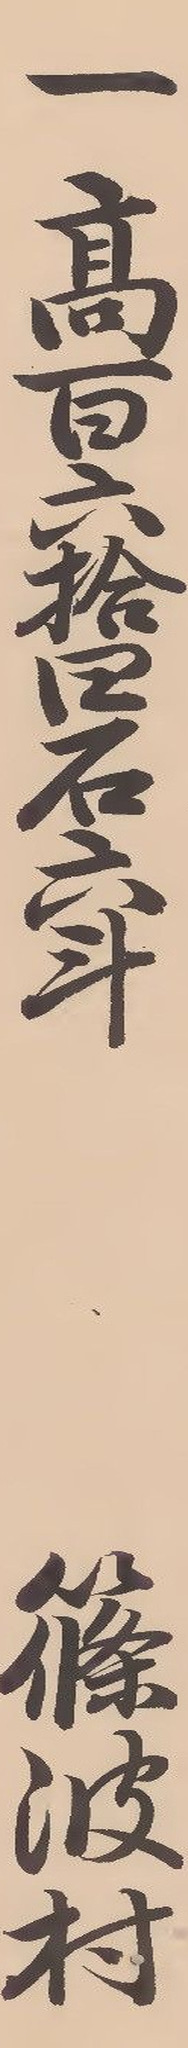一高百六拾四石六斗篠波村
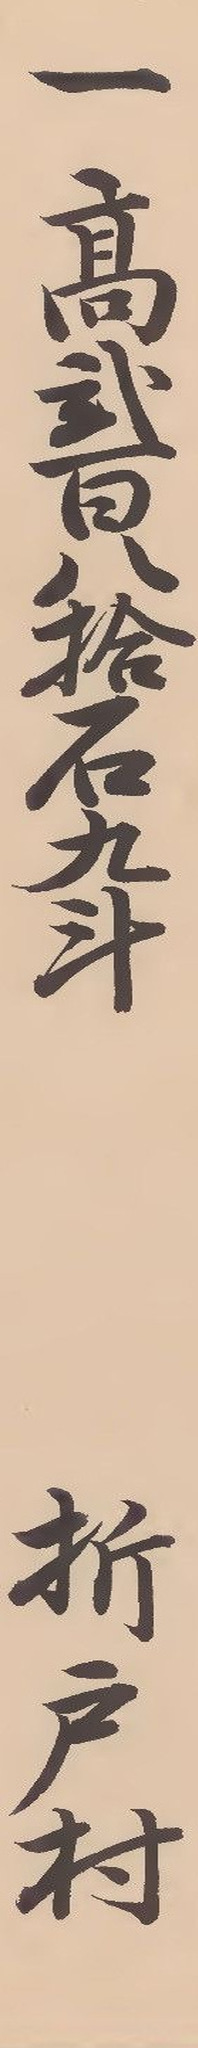一高弐百八拾石九斗折戸村
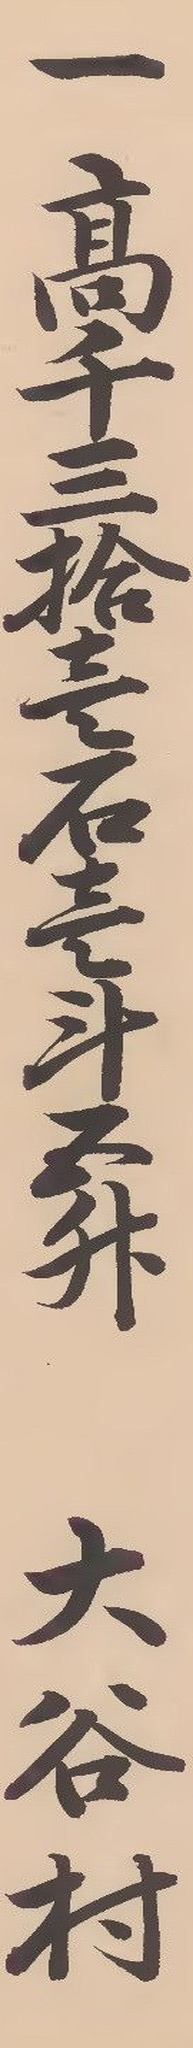一高千三拾壱石壱斗五升大谷村

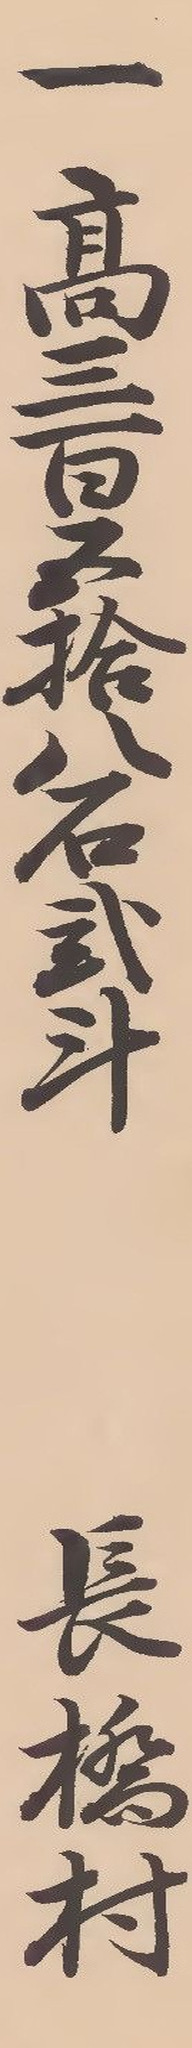一高三百五拾八石弐斗長橋村
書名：能登国郷帳
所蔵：国立公文書館 National Archives of Japan
